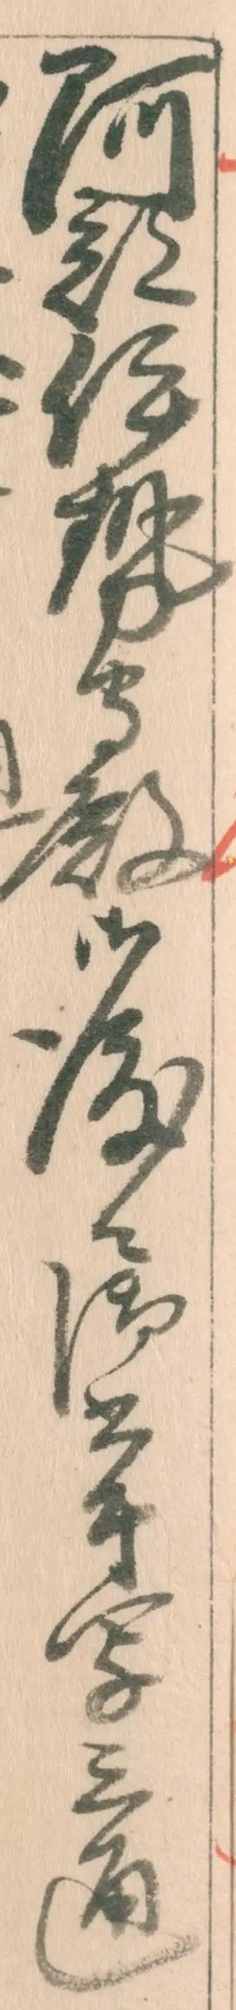│阿部伊勢守殿御渡之御書付写三通
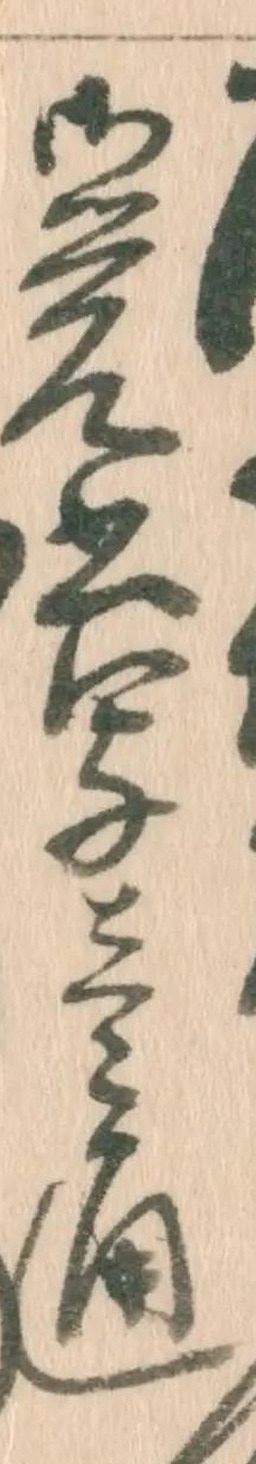│御覚書写壱通
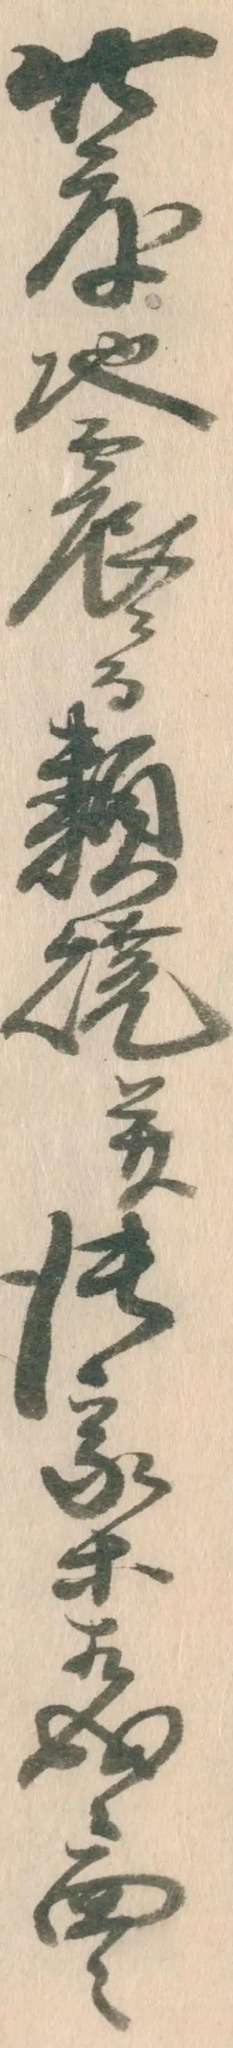此度地震ニて類焼幷潰家等相成候面〻
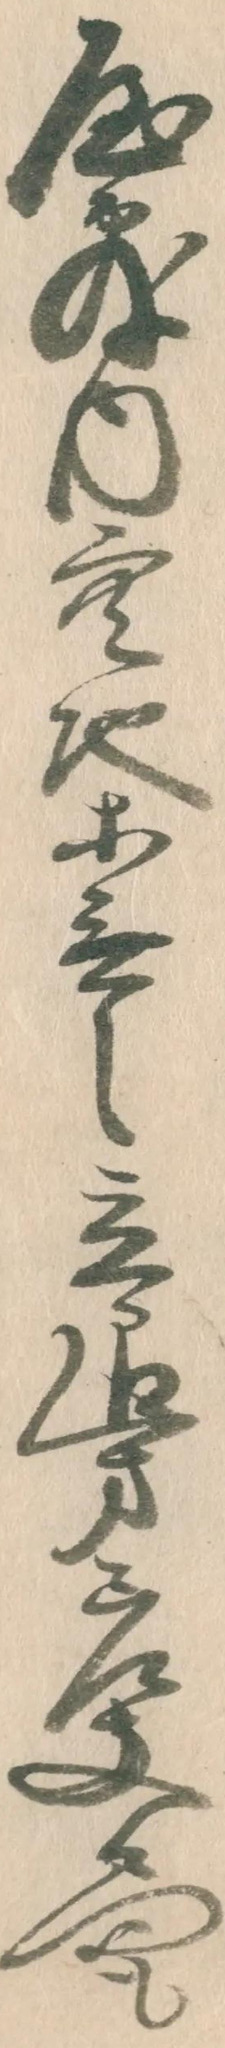屋敷内空地等無之立退方差支候向も
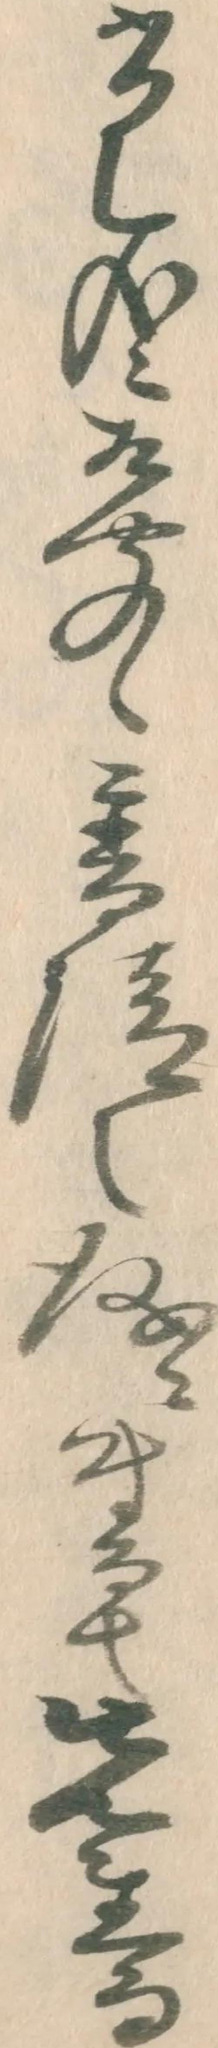有之哉ニ相聞候普請之儀ニ付ては先達て

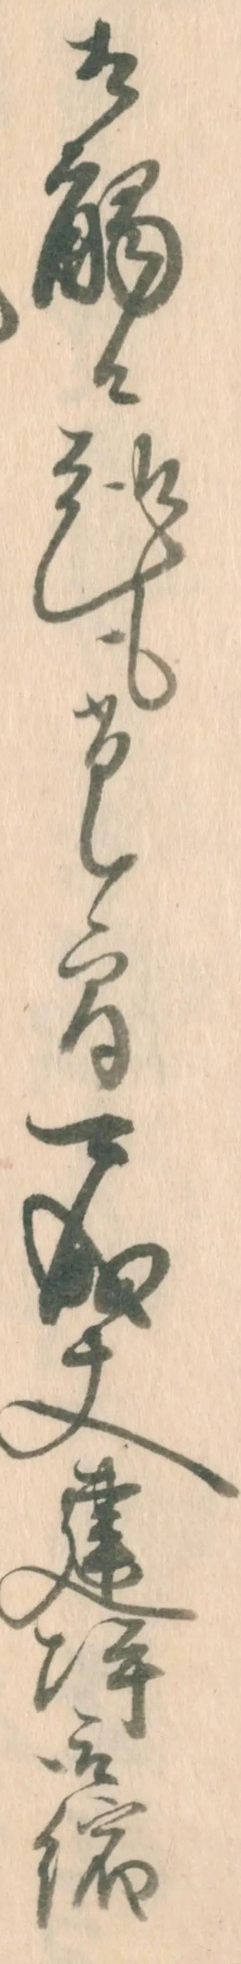相触候趣も有之候間可成丈建坪取縮
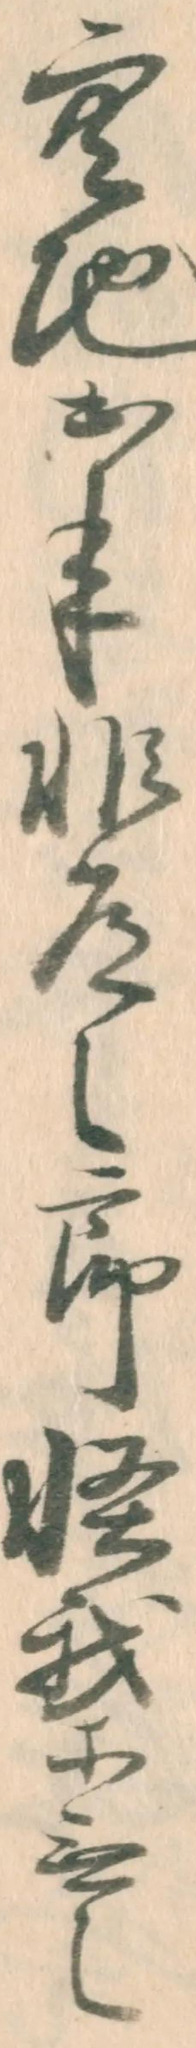空地出来非常之節怪我等無之
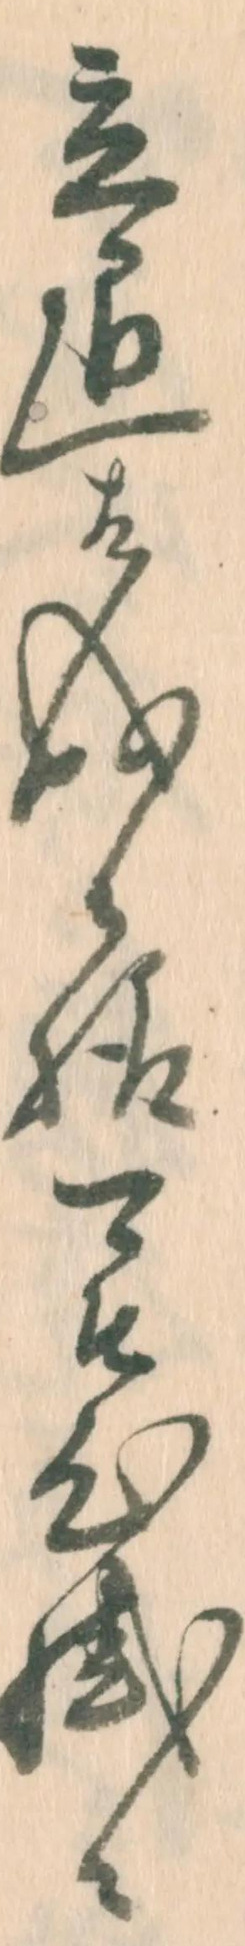立退相成候様可被心掛候
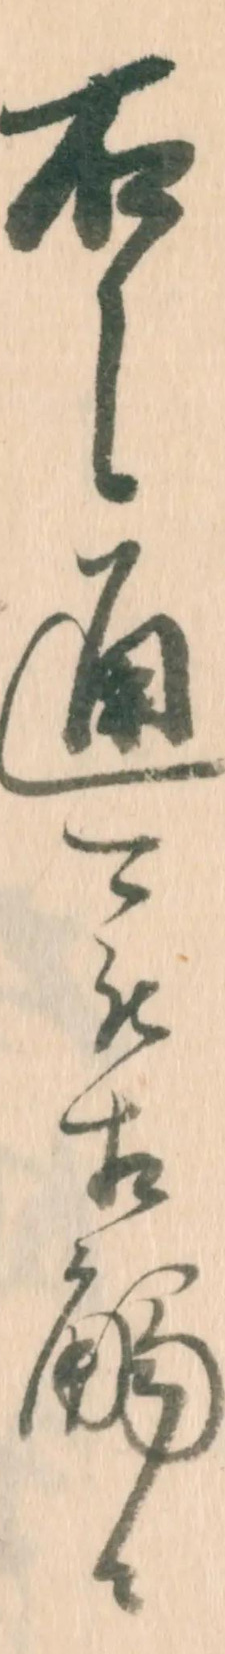右之通可被相触候
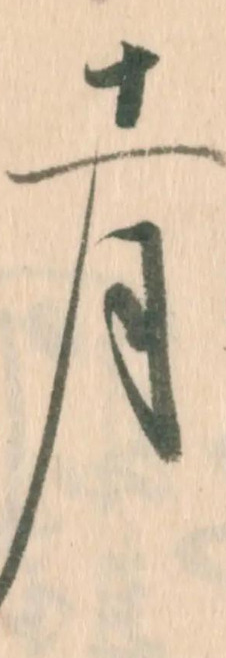十一月
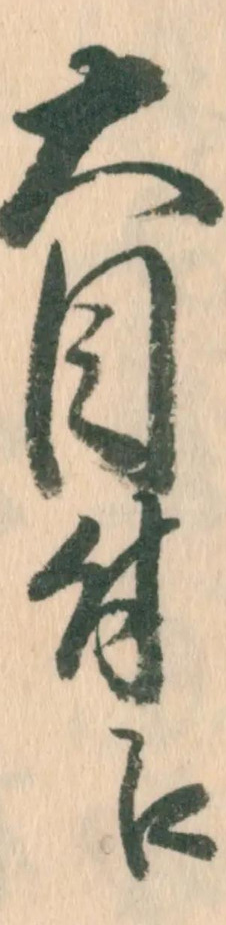│大目付え
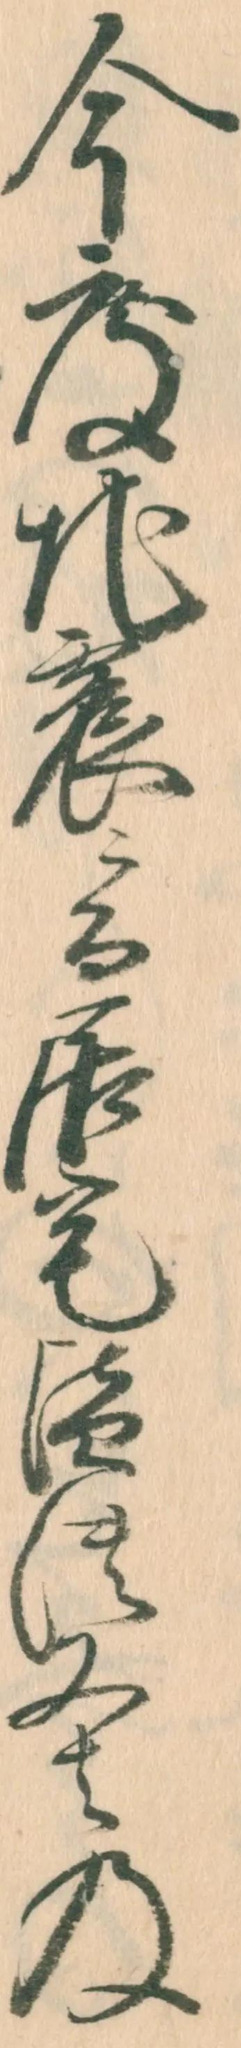今度地震ニて居宅総潰又は及
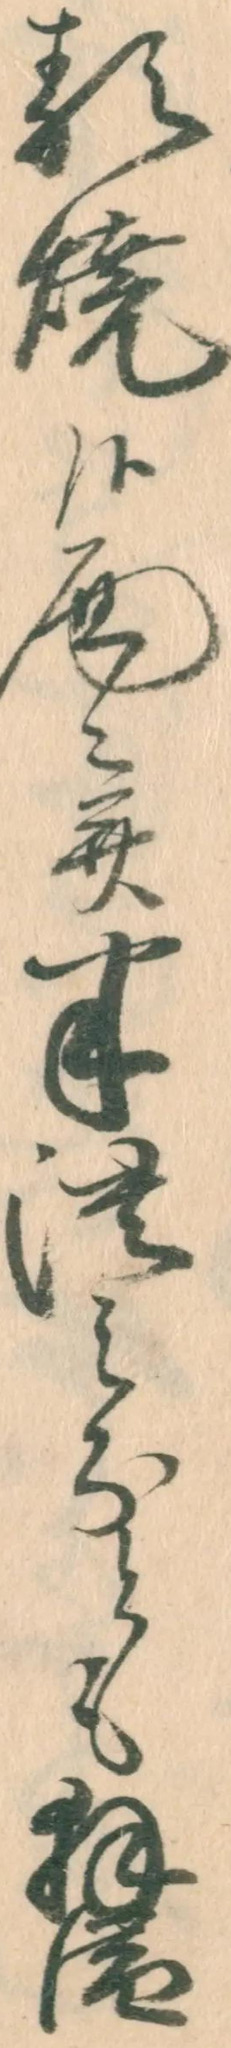類焼候面〻幷半潰之分とも拝借
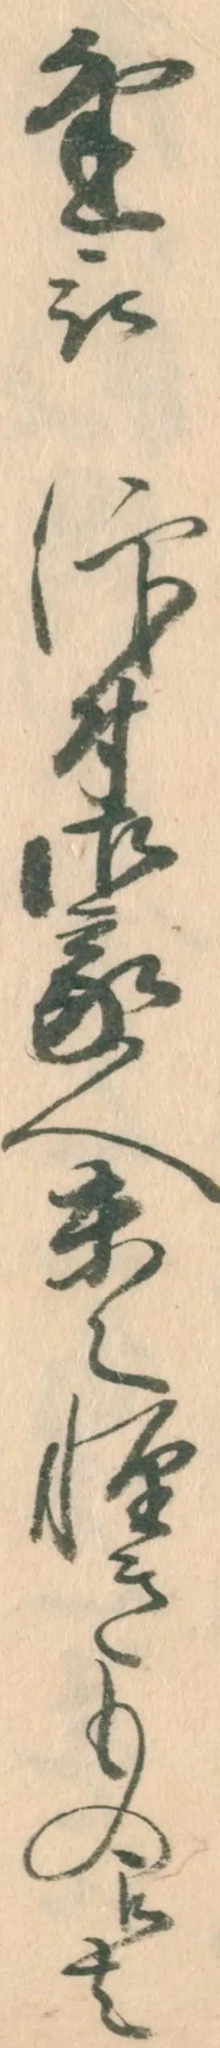金被仰付御家人末〻軽きものえは

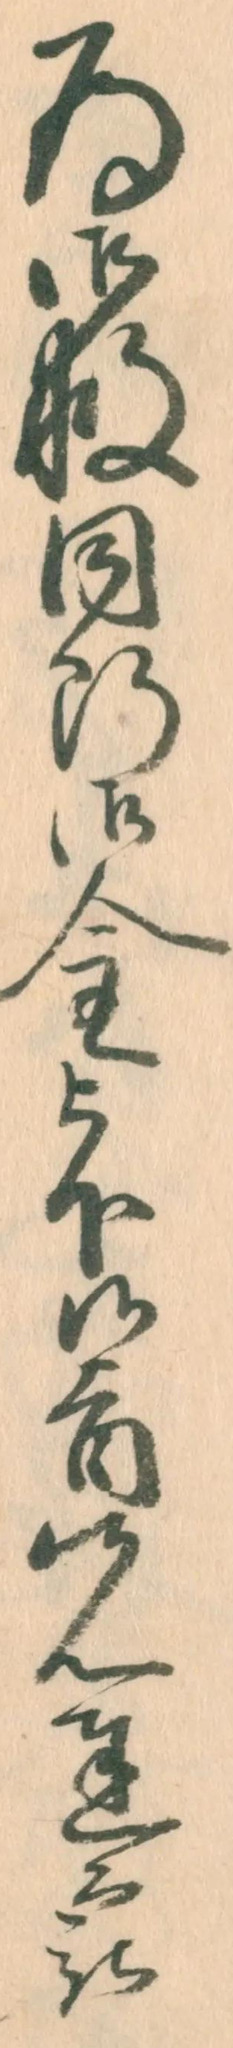為御救同断御金被下候旨先達て被
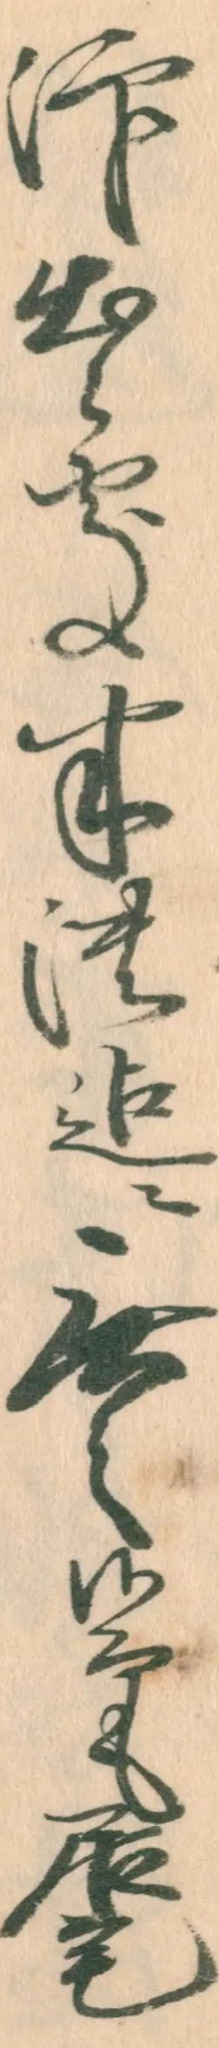仰出候処半潰迠ニ無之候ても居宅
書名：地震災書留 2巻. [2] 内表紙に「地震一件　安政二卯年十月」とあり
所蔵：国立国会図書館 National Diet Library, JAPAN
